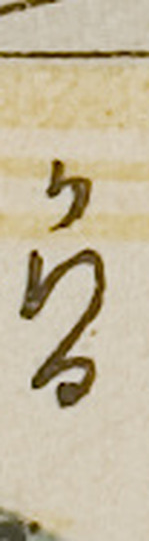かはる
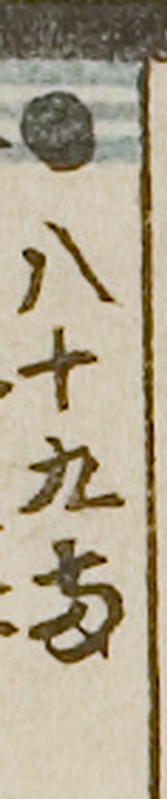●八十九両
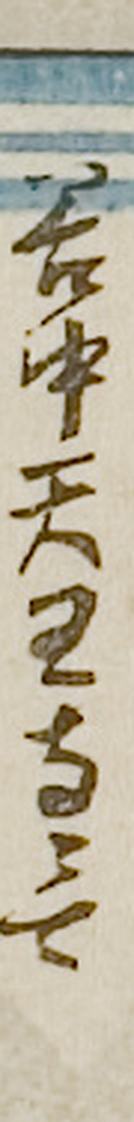谷中天王寺にて
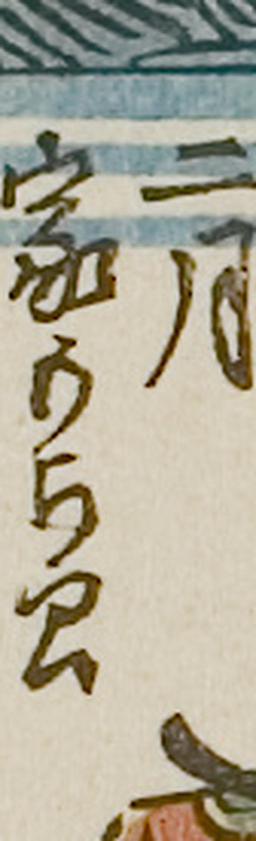家もち公
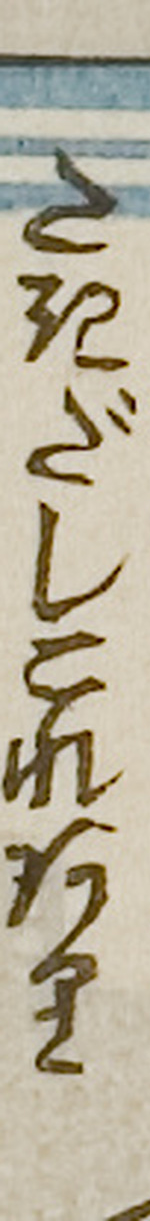たきだしこれあり
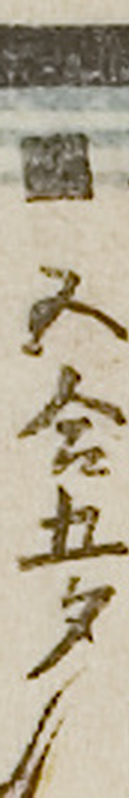五合五勺
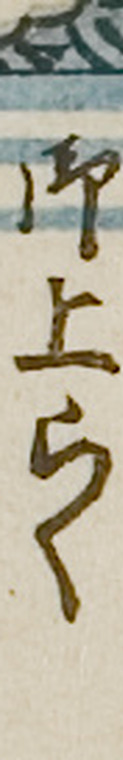御上らく
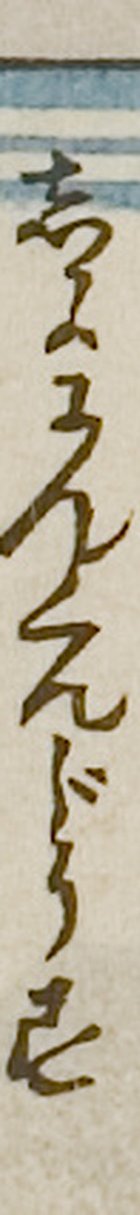しよにんくんじうす
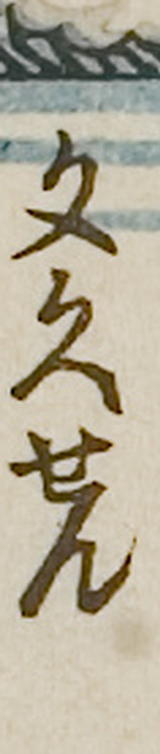文久せん
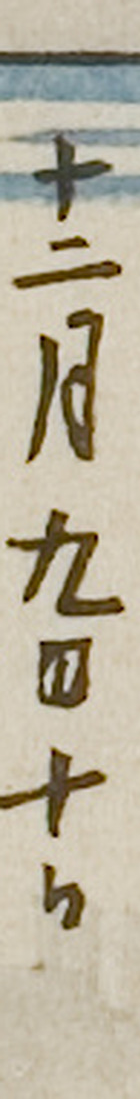十二月九日十日
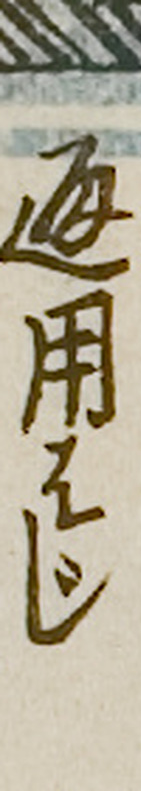通用はじ
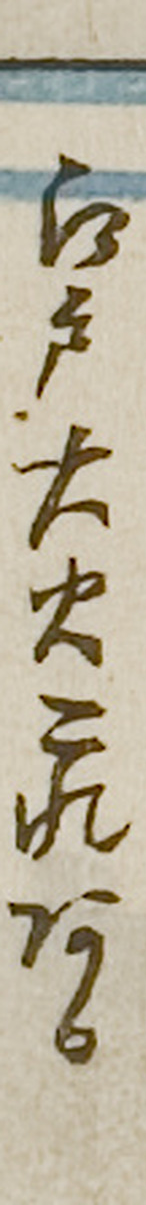江戸大火これある
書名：嘉永年間より米相場直段并年代記書抜大新版
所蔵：東京大学総合図書館 General Library in the University of Tokyo, JAPAN
